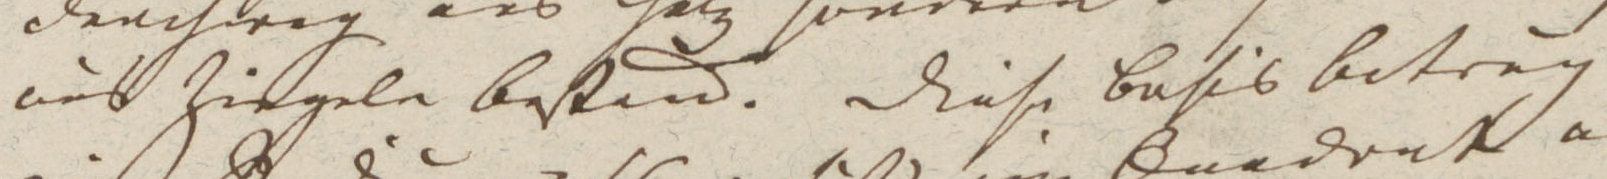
aus Ziegeln bestand. Diese Basis betrug
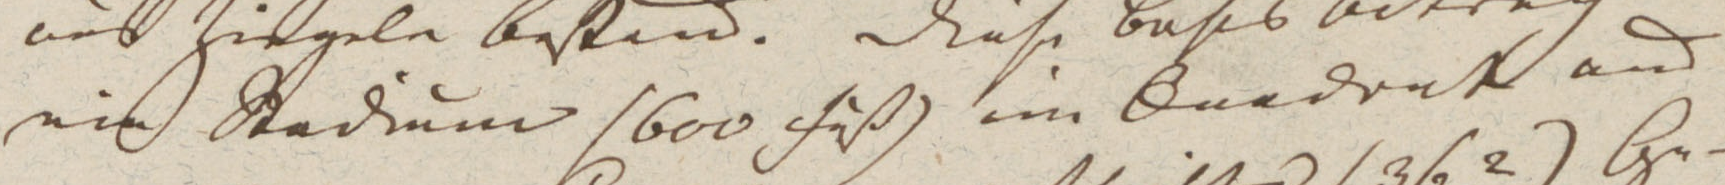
ein Stadium (600 Fuss) im Quadrat und
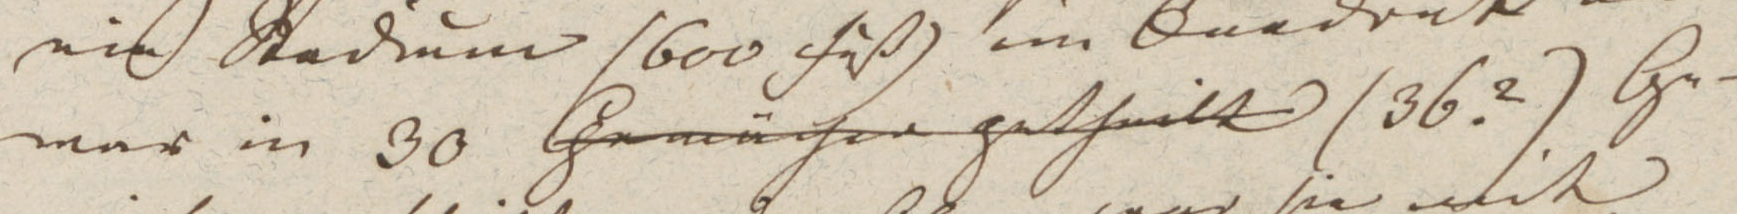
war in 30 Gemächer getheilt (36?) Ge-
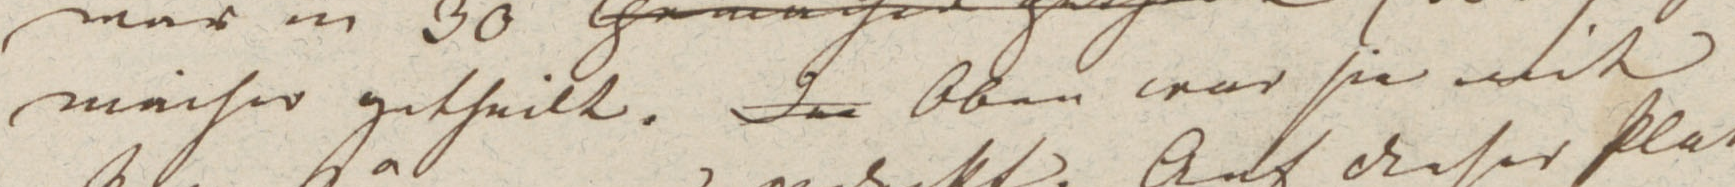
mächer getheilt. Oben war sie mit
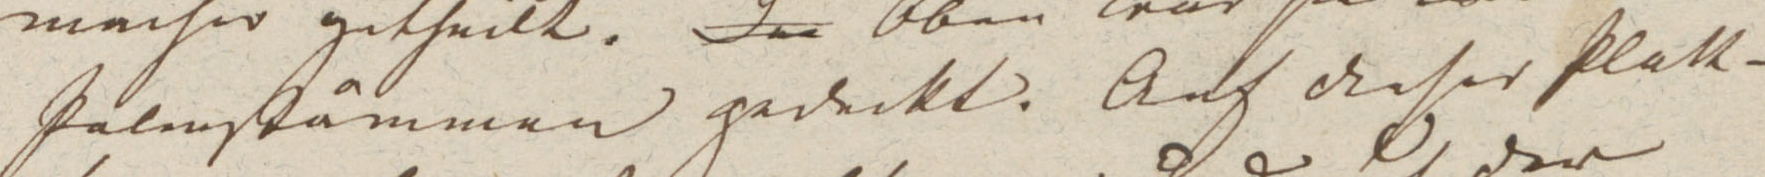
Palmstämmen gedeckt. Auf dieser Platt-
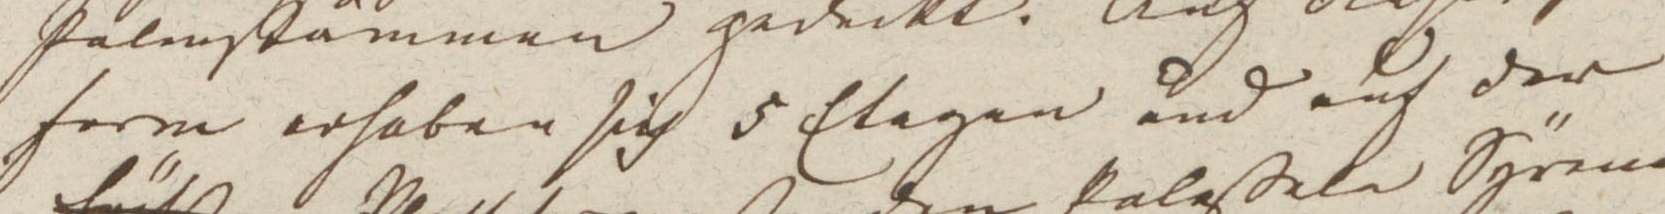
form erhoben sich 5 Etagen und auf der
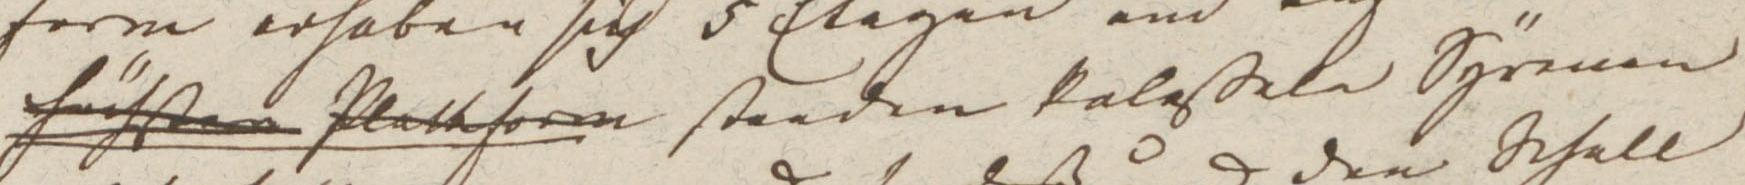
höchsten Plattform standen kolossale Syrenen
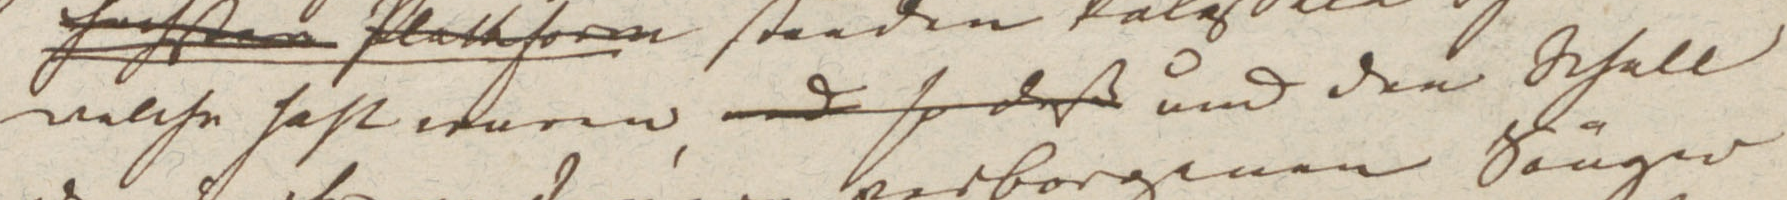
welche hohl waren, und so dass und den Schall
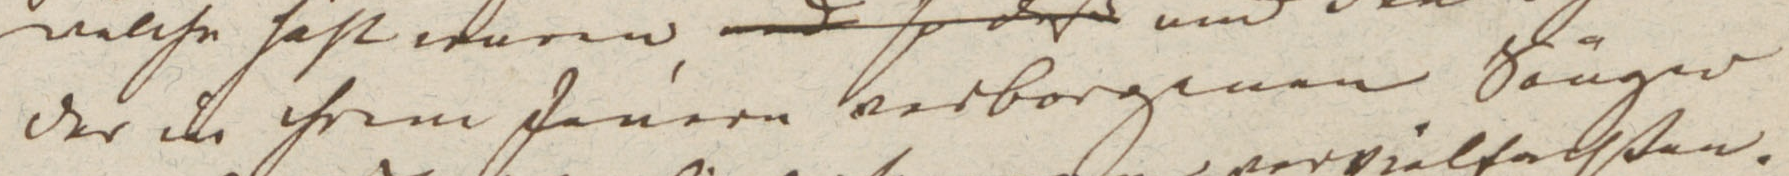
der in ihrem Innern verborgenen Sänger
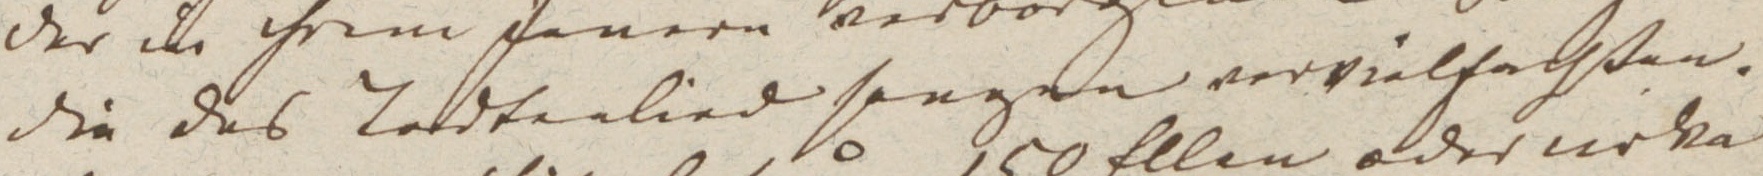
die das Todtenlied sangen vervielfachten.
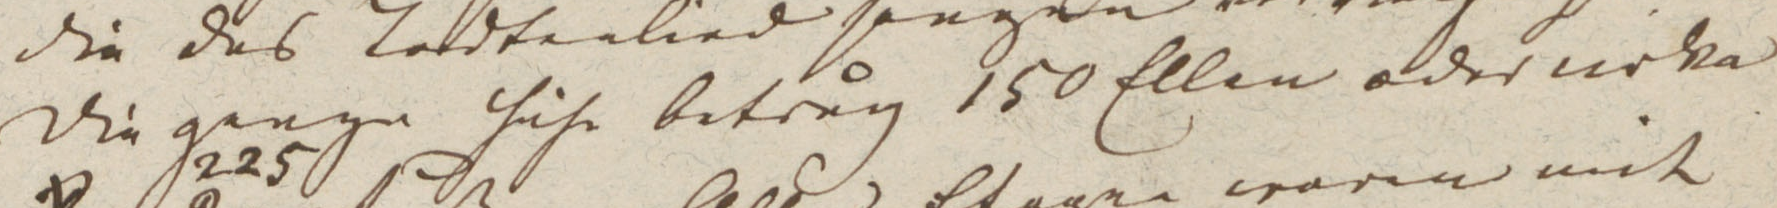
Die ganze Höhe betrug 150 Ellen oder cirka
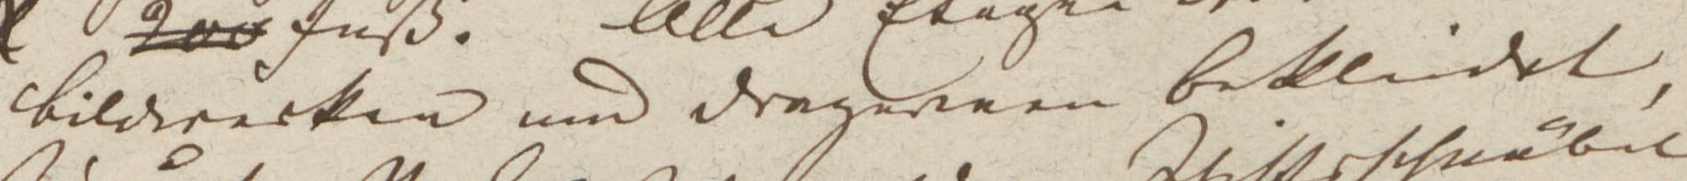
Bildwerken und Draperieen bekleidet,
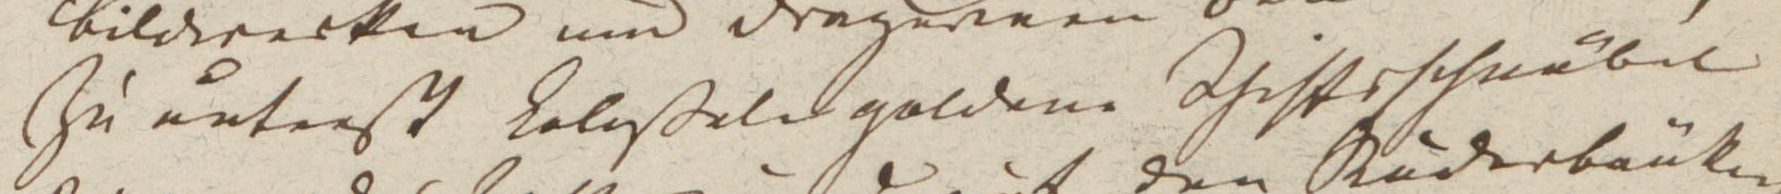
Zu unterst kolossale goldene Schiffsschnäbel
